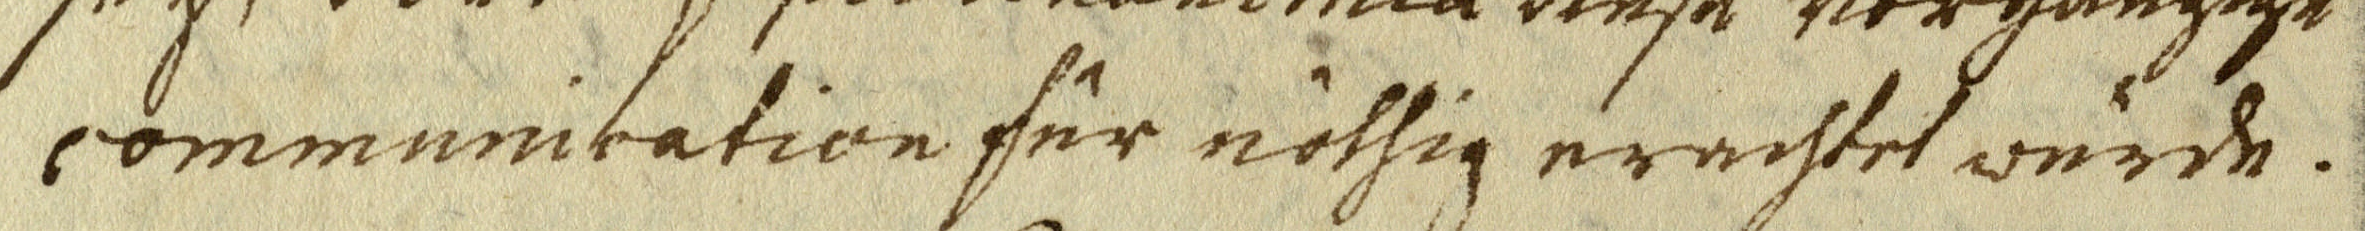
Communication für nöthig erachtet würde.
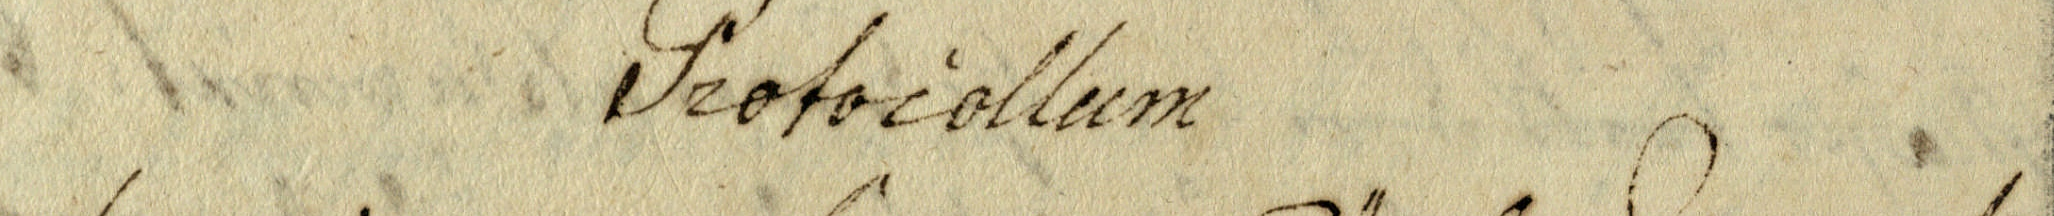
Protocollum
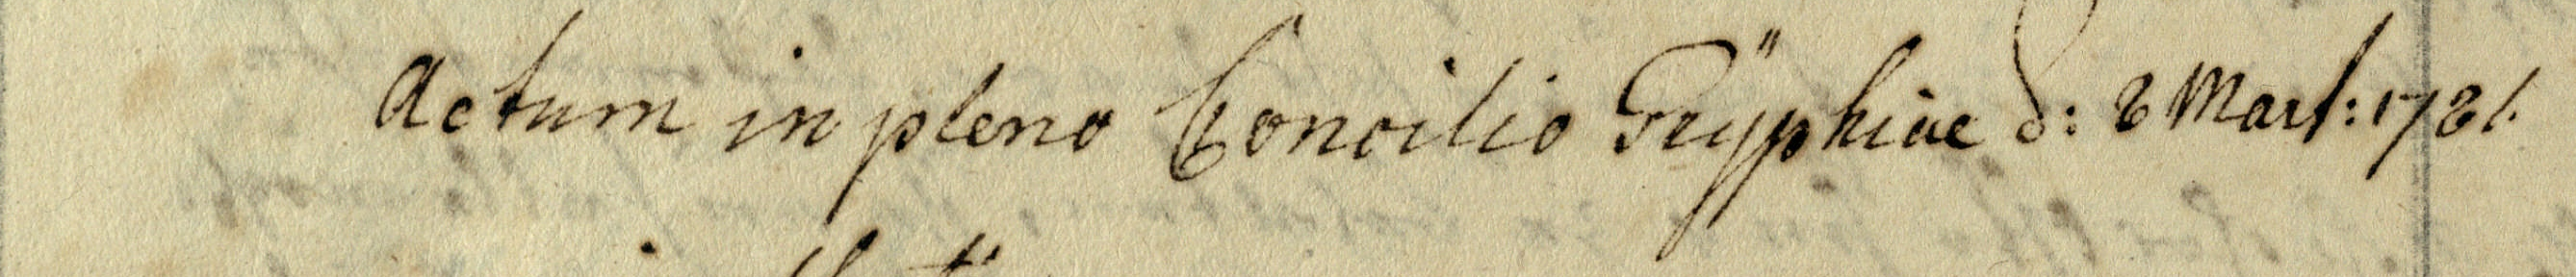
Actum in pleno Concilio Grÿphiae d. 8. Mart. 1781
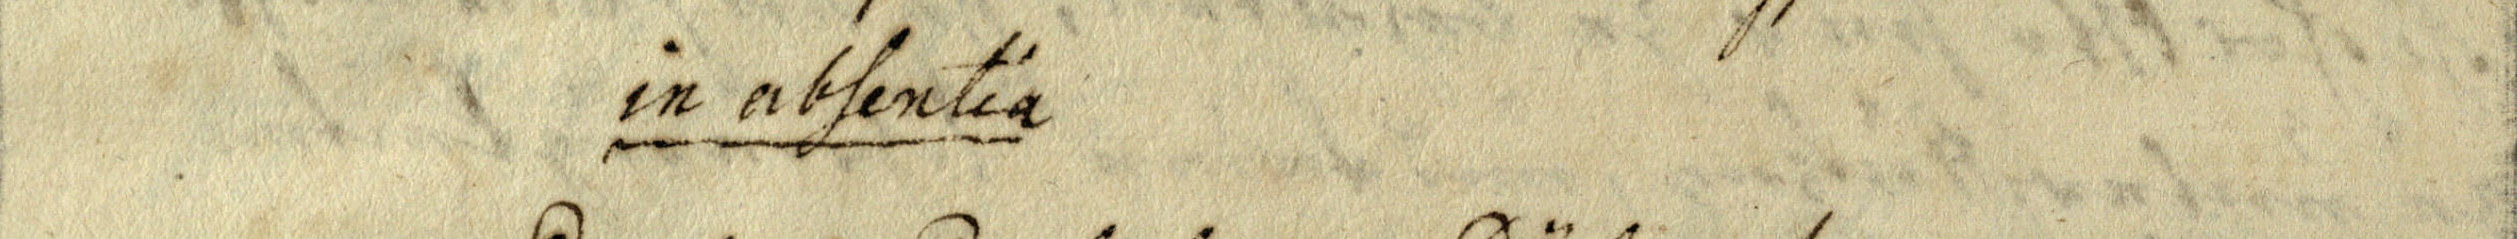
in absentia
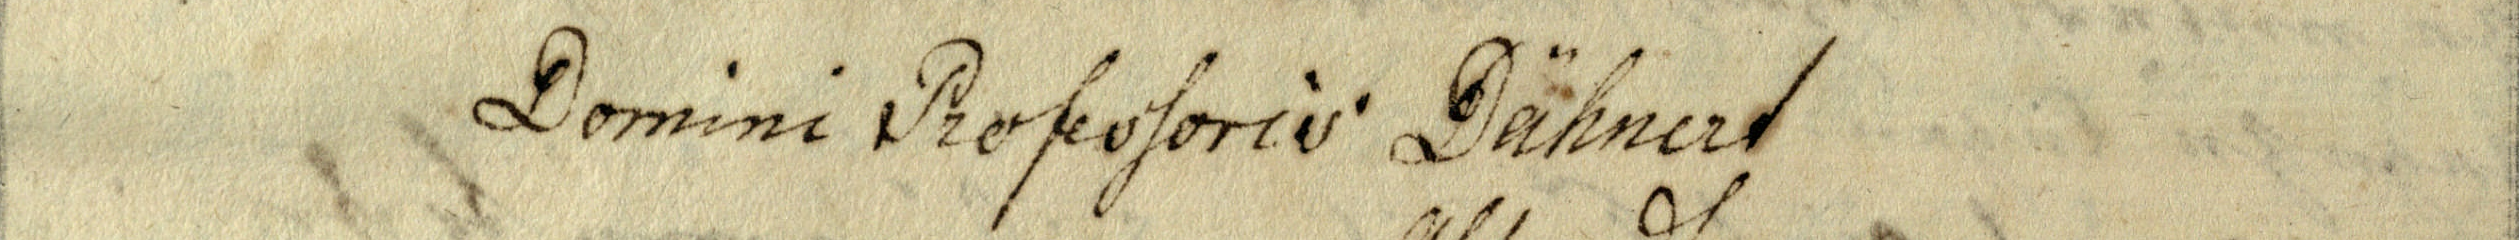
Domini Professoris Dähnert
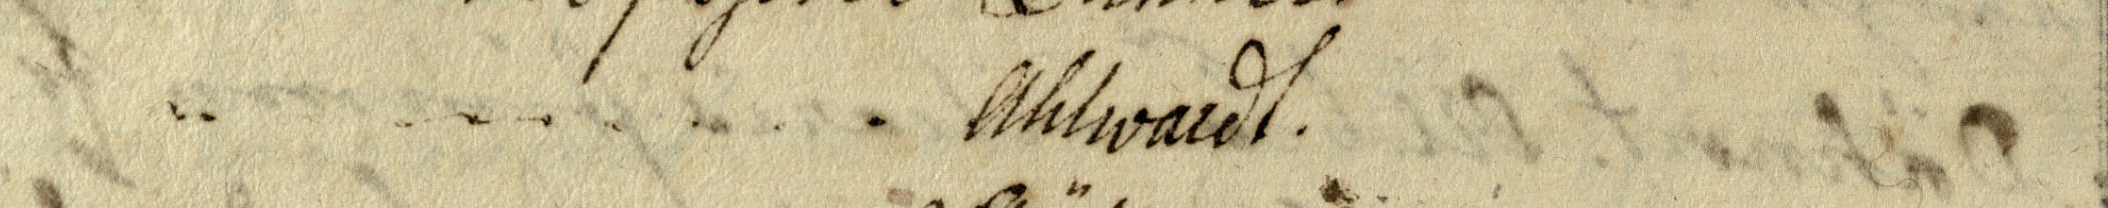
Ahlwardt.
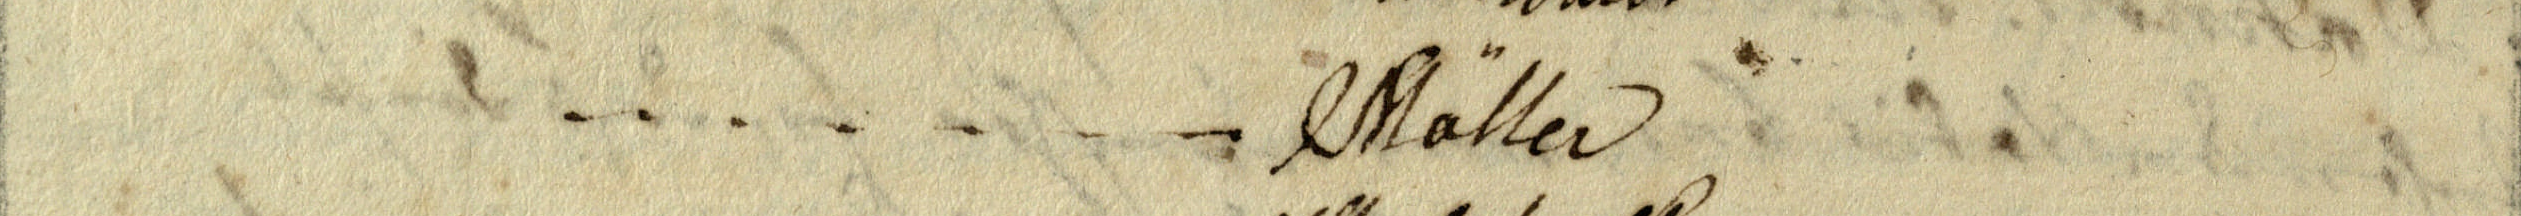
Möller
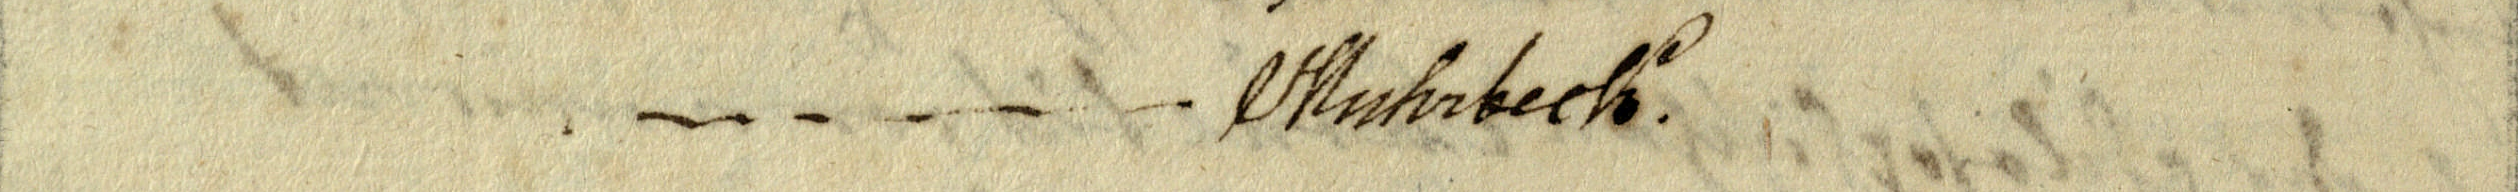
Muhrbeck.
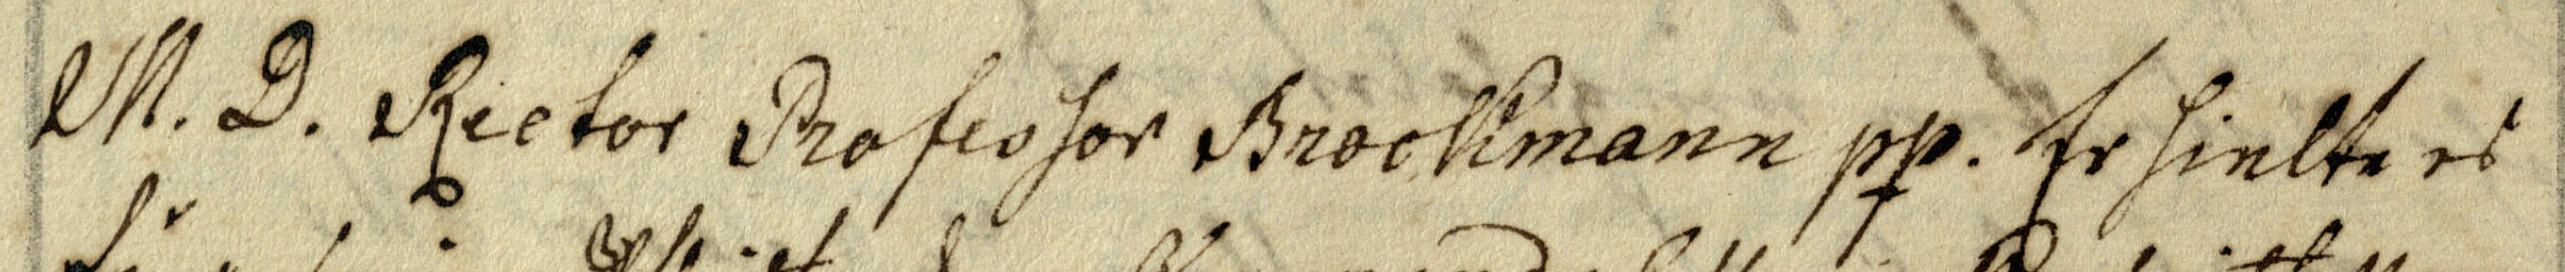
M. D. Rector Professor Brockmann pp. Er hielte es
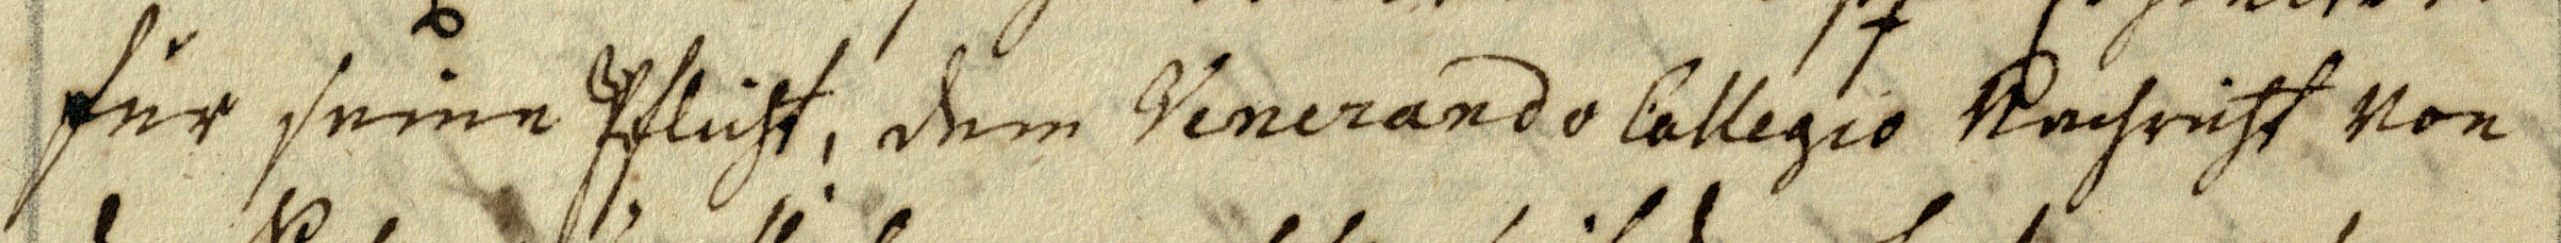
für seine Pflicht, dem Venerando Collegio Nachricht von
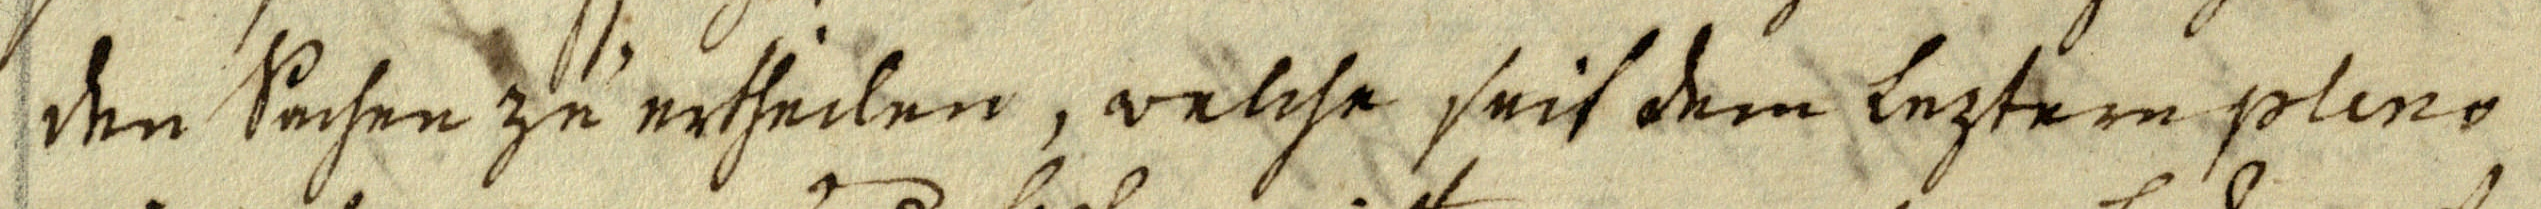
den Sachen zu ertheilen, welche seit dem lezten pleno
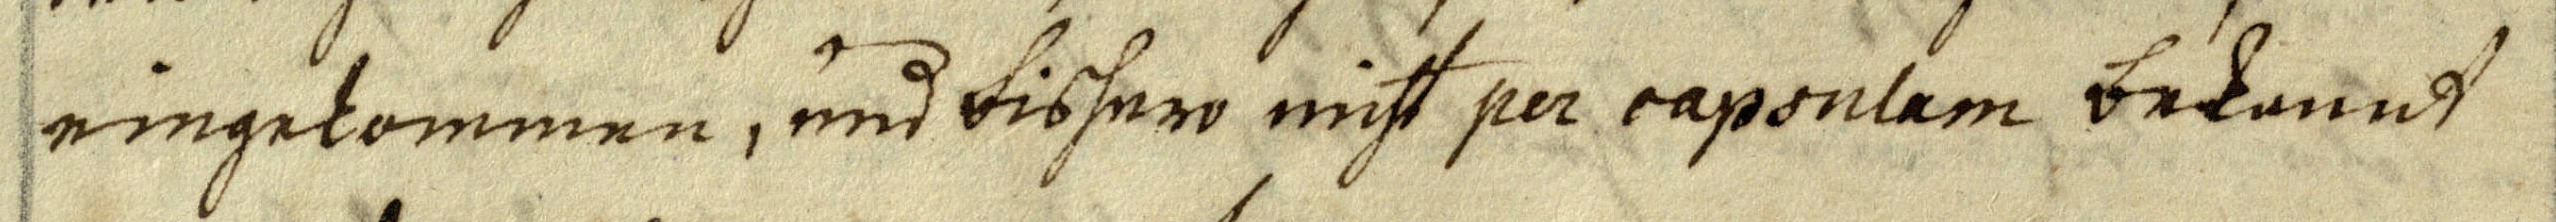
eingekommen, und bishero nicht per capsulam bekannt
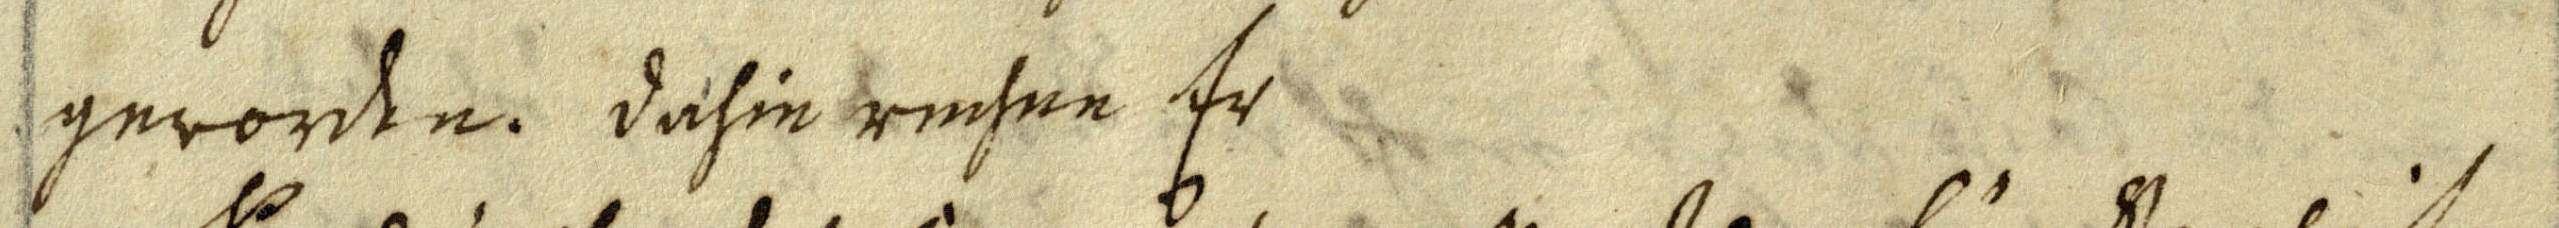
geworden. Dahin rechne Er
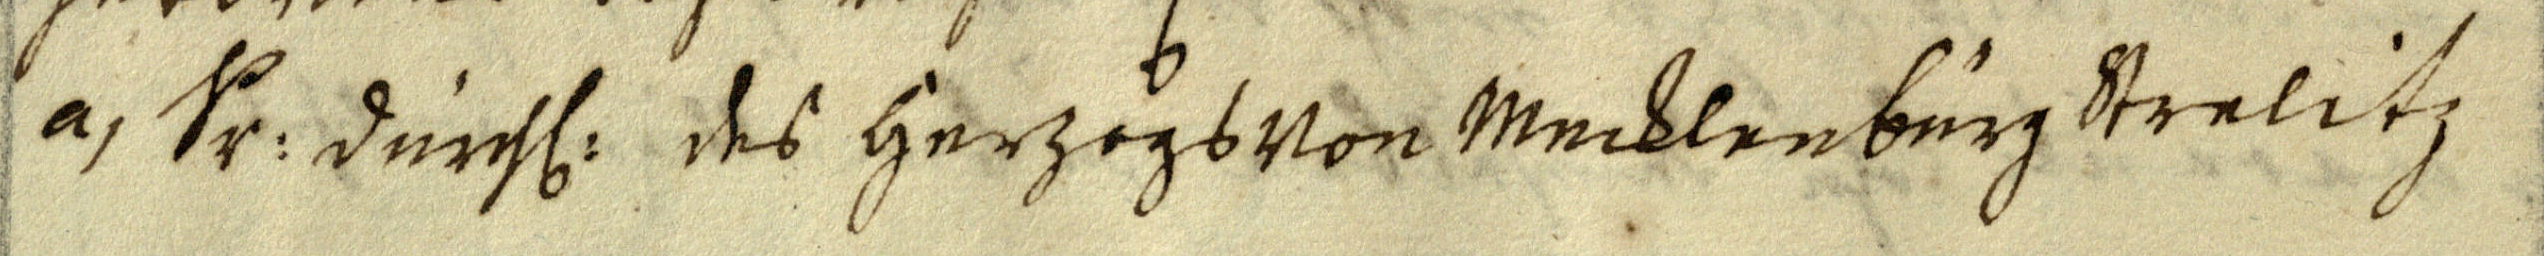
a, Sr Durchl. des Herzogs von Mecklenburg Strelitz
